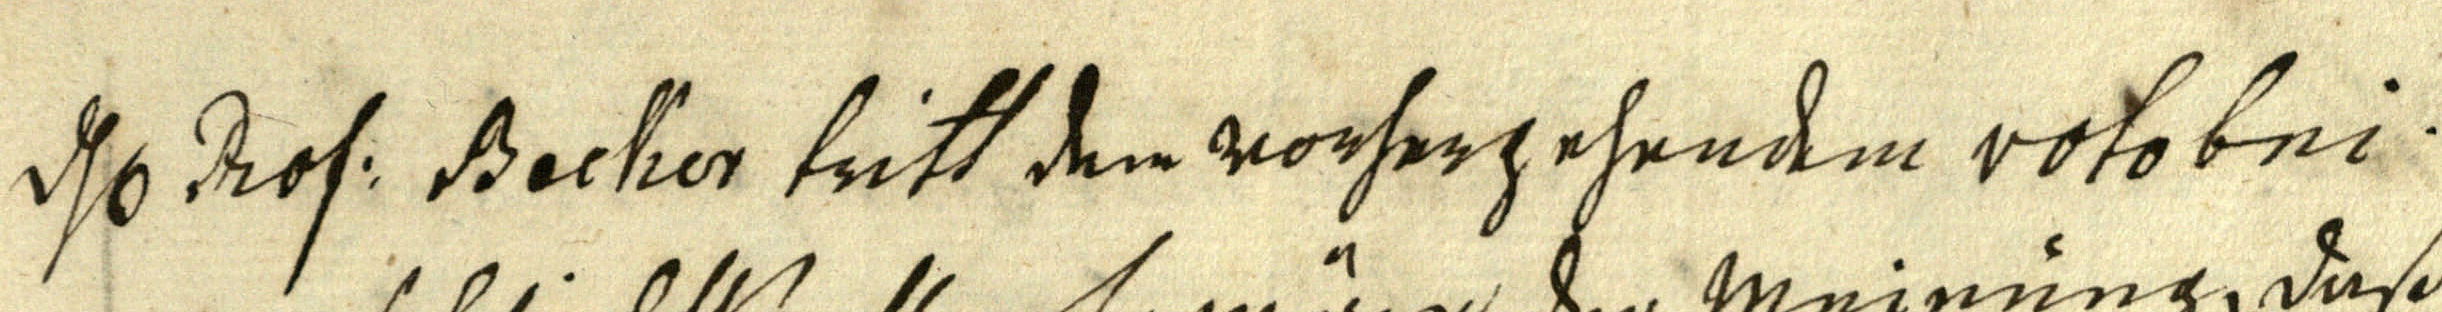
dh Prof. Becker tritt dem vorhergehenden voto bei.
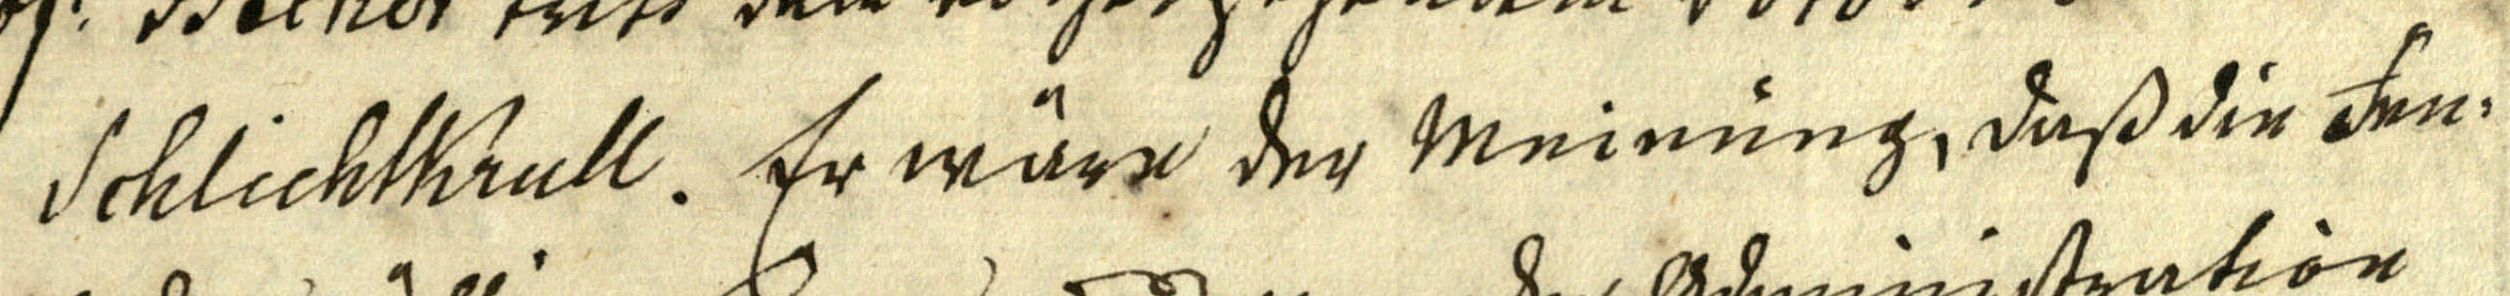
Schlichtkrull. Er wäre der Meinung, daß die Fen¬
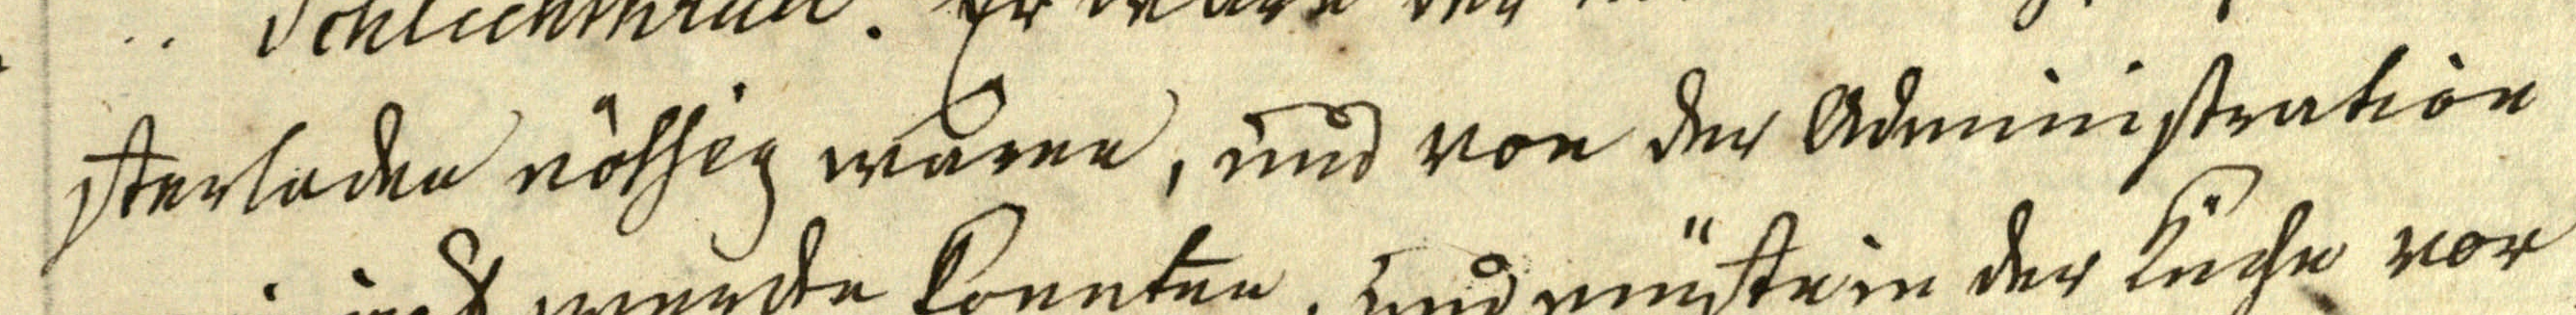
sterladen nöthig wären, und von der Administration
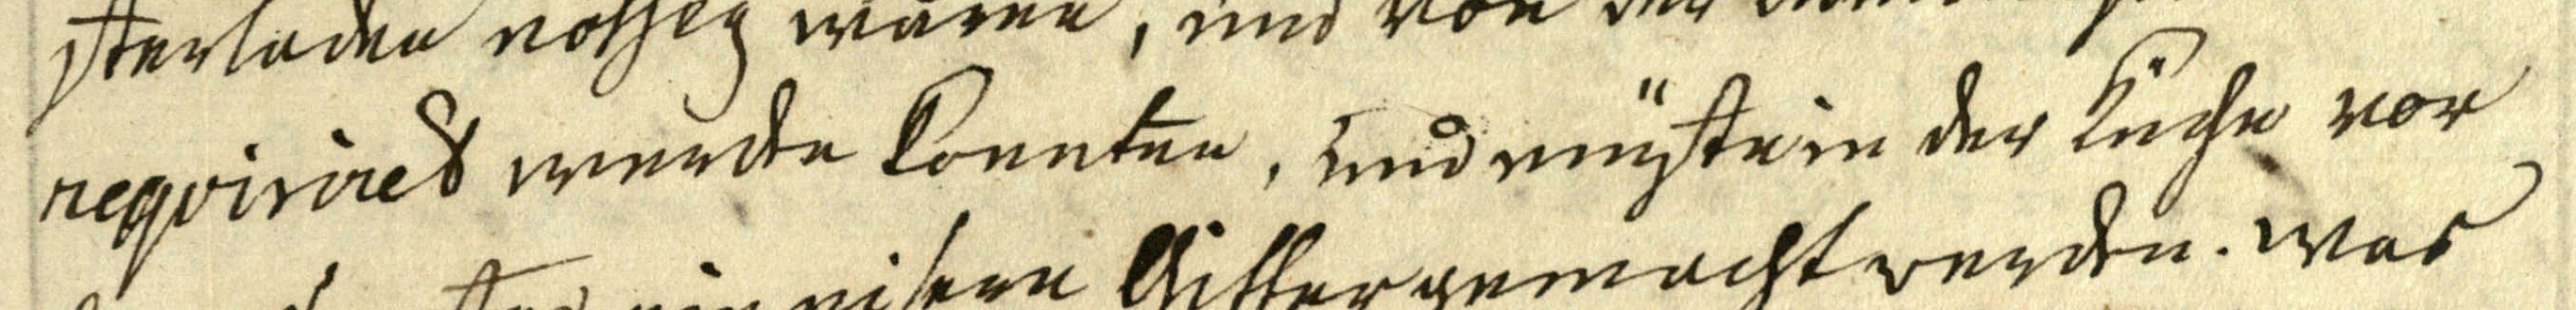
requiriret werden könnten, und müste in der Küche vor
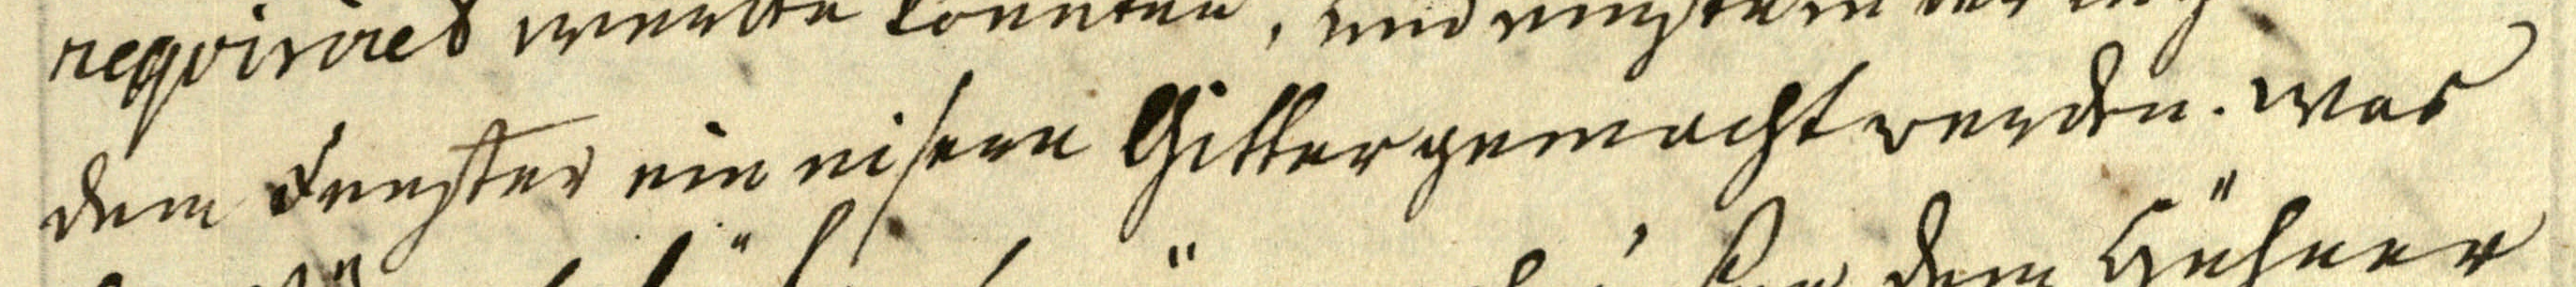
dem Fenster ein eisern Gitter gemacht werden. Was
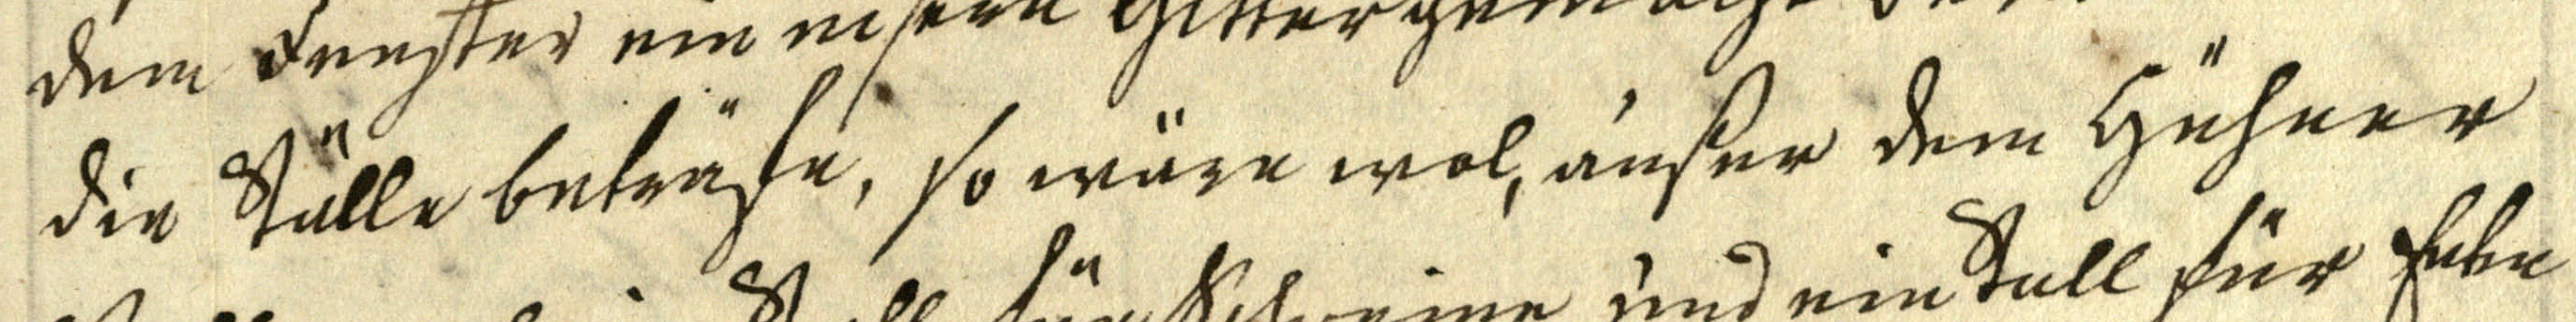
die Ställe beträfe, so wäre wol, außen dem Hühner
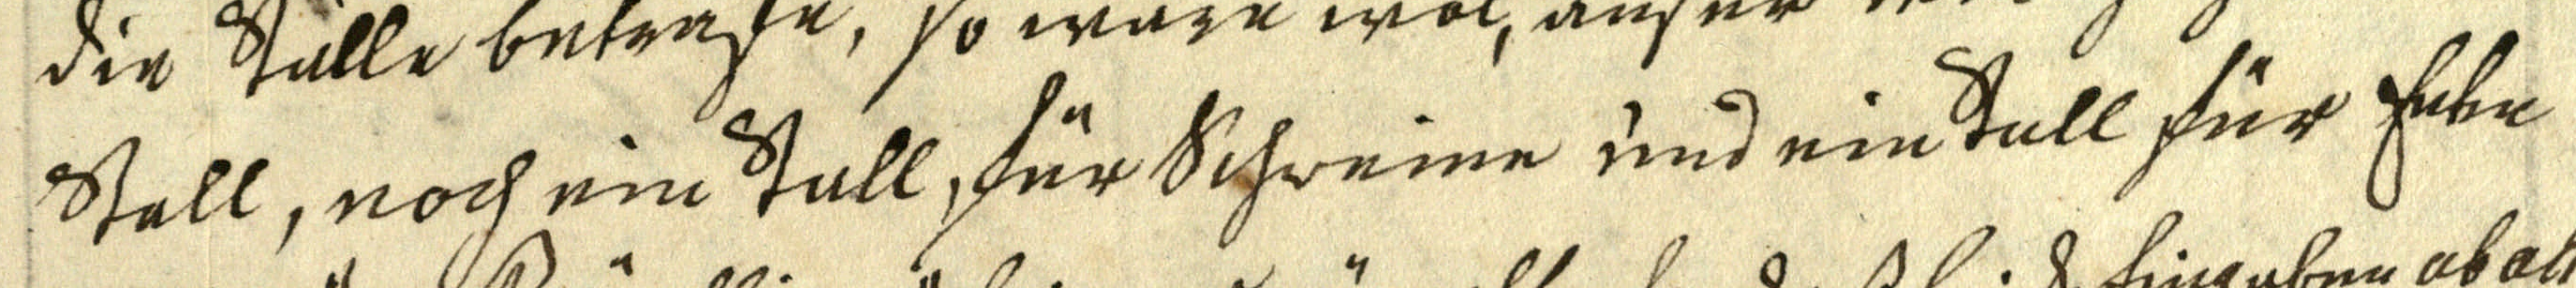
Stall, noch ein Stall, für Schweine und ein Stall für Enten
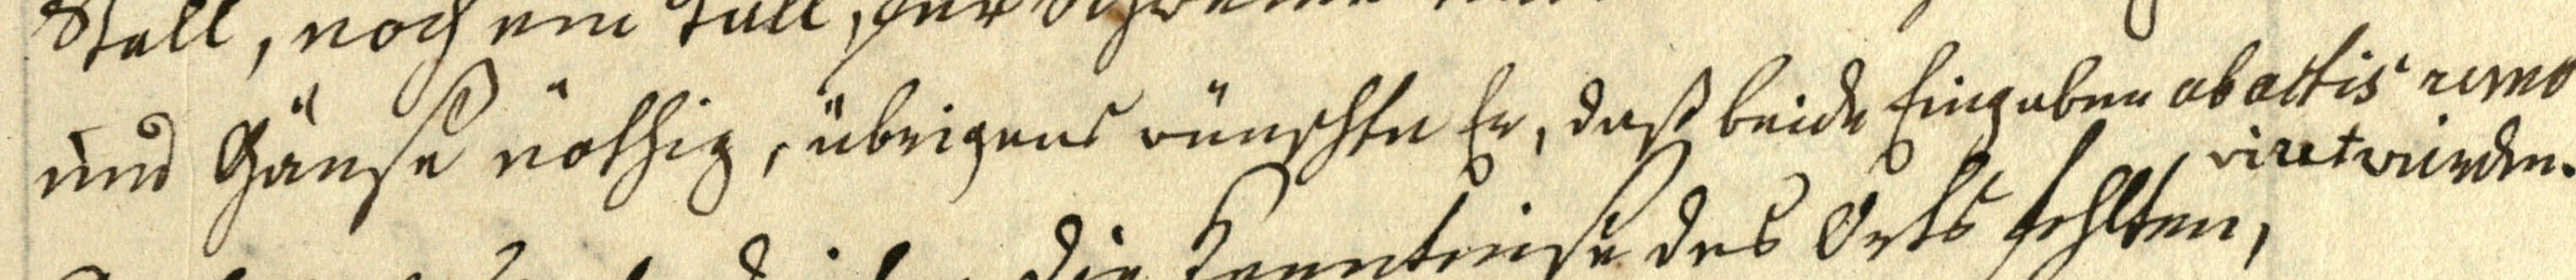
und Gänße nöthig, übrigens wünschte Er, daß beide Eingaben ob actis remo
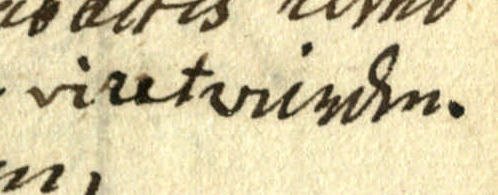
viret würden.
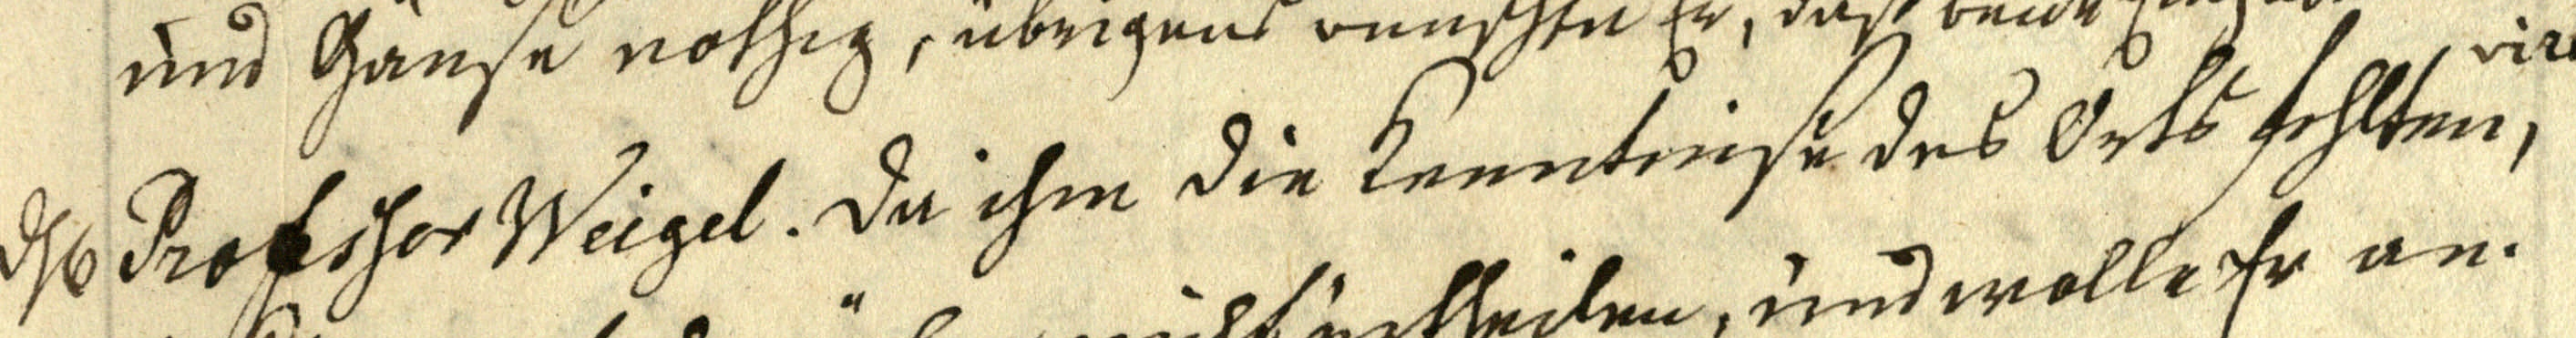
dh Professor Weigel. Da ihm die Kenntniße des Orts fehlten,
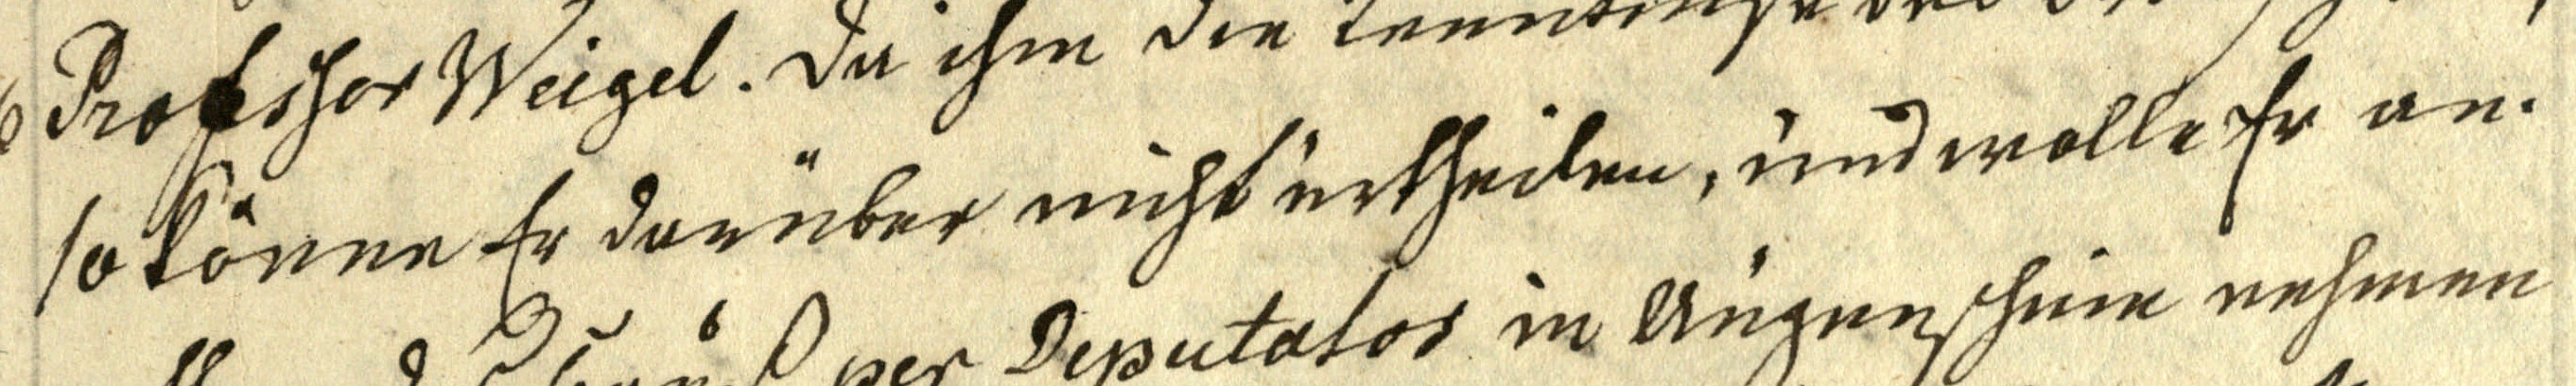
so könne Er darüber nicht urtheilen, und wolle Er an¬
